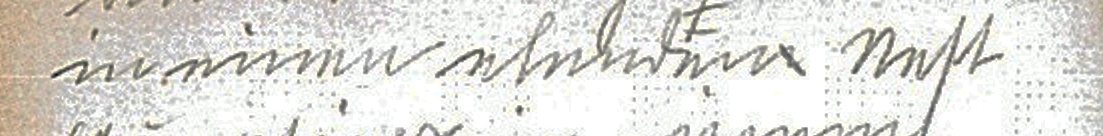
in einem elenden Nest
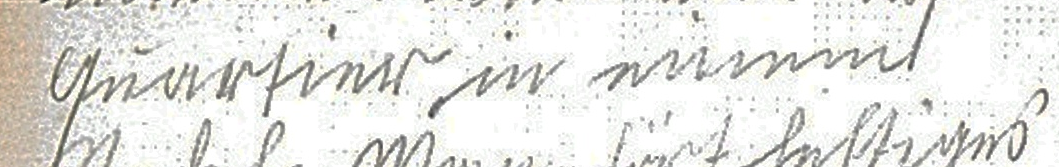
Quartier in einem
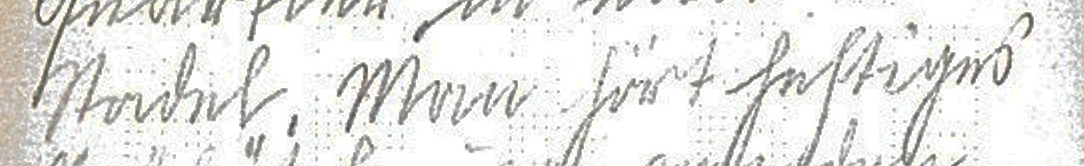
Stadel. Man hört heftiges
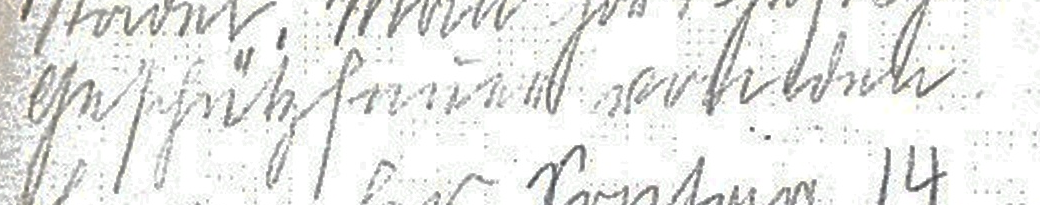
Geschützfeuer von den
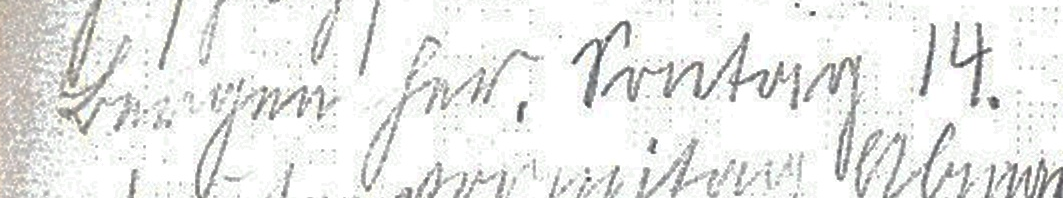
bergen her. Sonntag 14
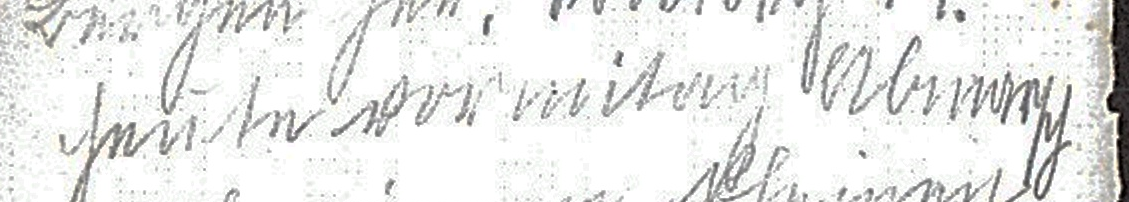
heute vormittag Abmarsch
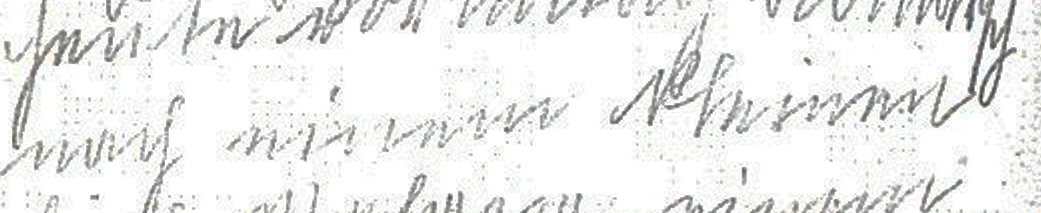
nach einem kleinen
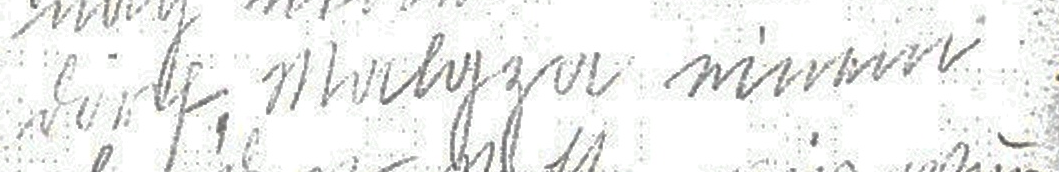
dorf, Malgza einem
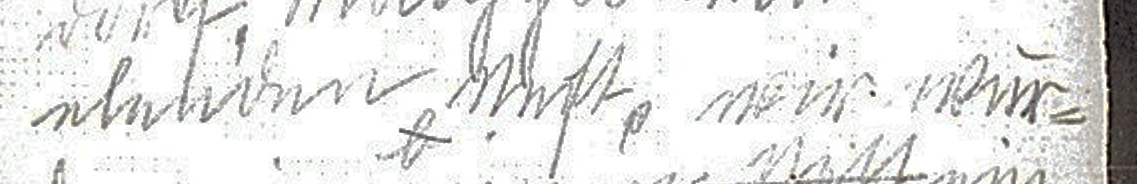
elenden Nest, wir wur-
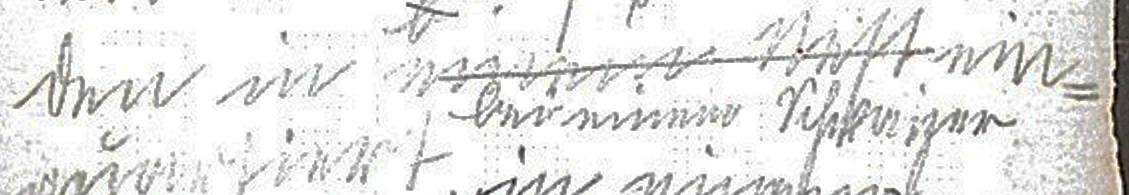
den bei einem Schreiner ein-
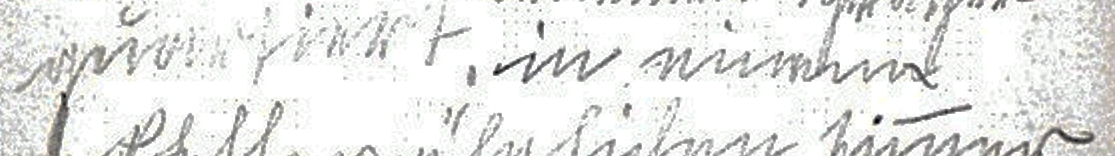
quartier in einem
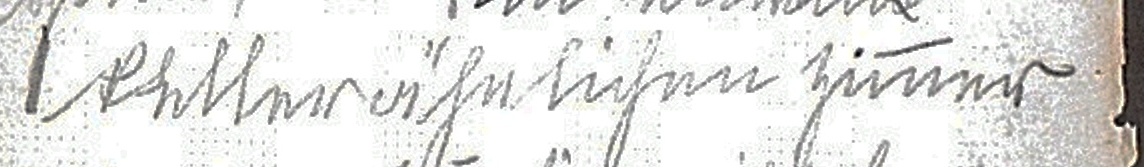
Kellerähnlichen Zimmer
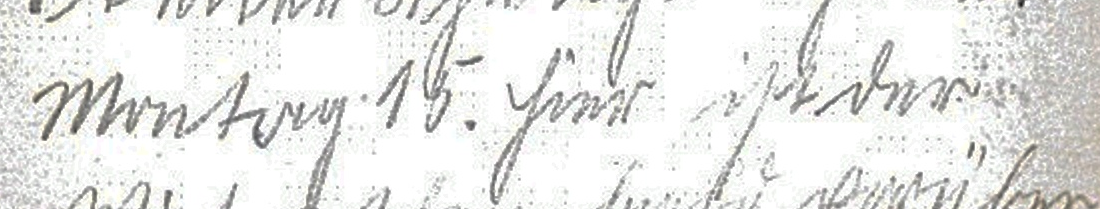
Montag 15. Hier ist der
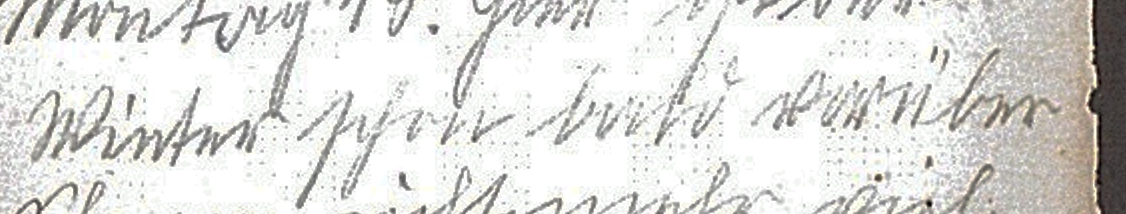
Winter schon bald vorüber
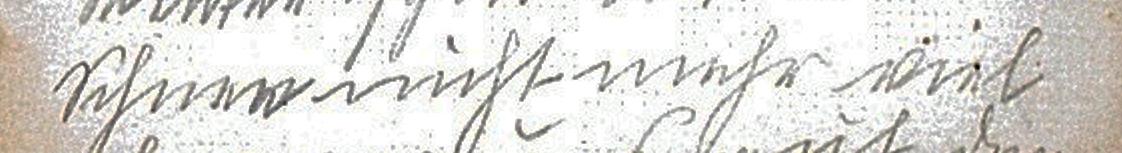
Schnee nicht mehr viel
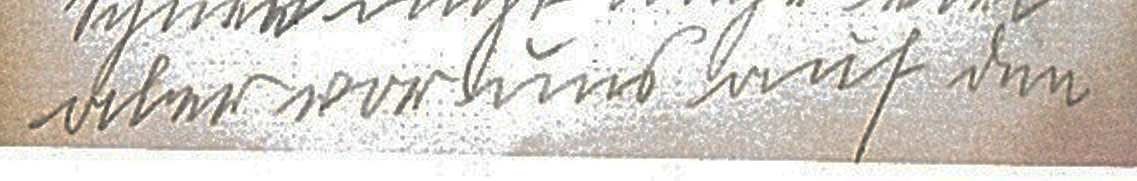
aber vor uns auf den
